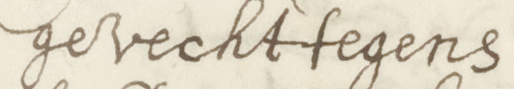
gevecht tegens
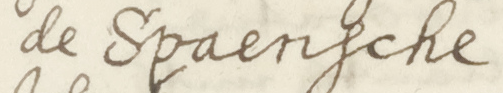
de Spaensche
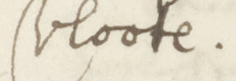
vloote.
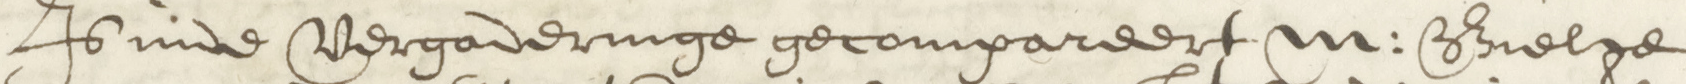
Is in de vergaderinge gecompareert M: Bielge
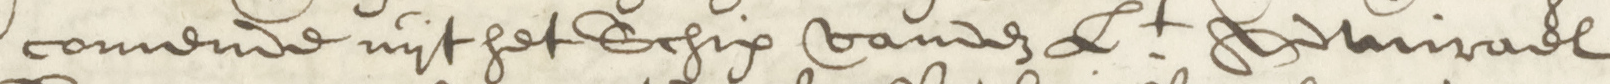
comende uijt het Schip vanden Lt Admirael
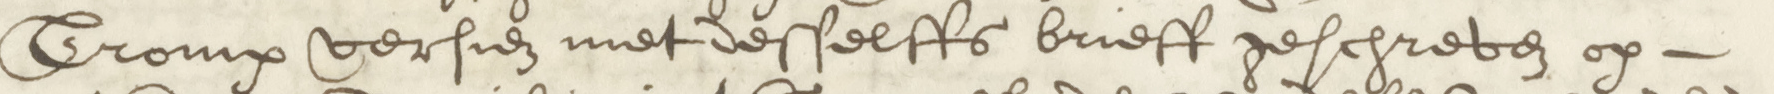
Tromp versien met desselffs brieff geschreven op —
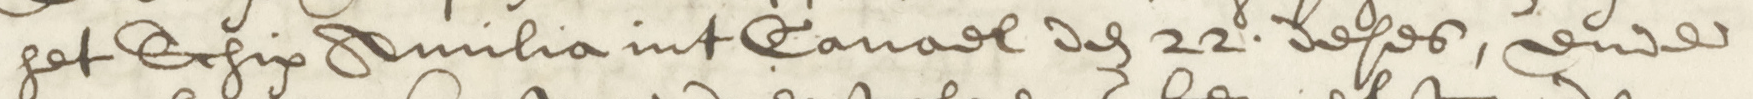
het Schip Amilia int Canael den 22. deses, ende
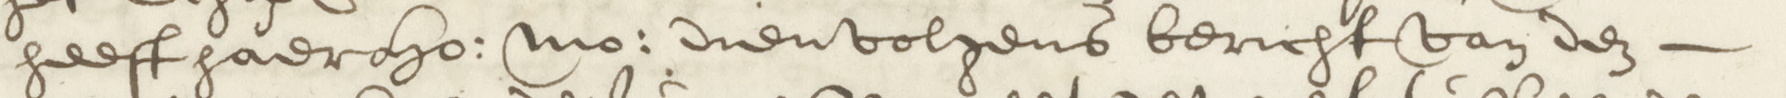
heeft haer Ho:Mo: dienvolgens bericht van den —
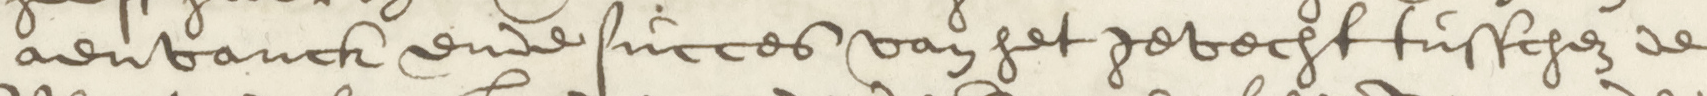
aenvanck ende succes van het gevecht tusschen de
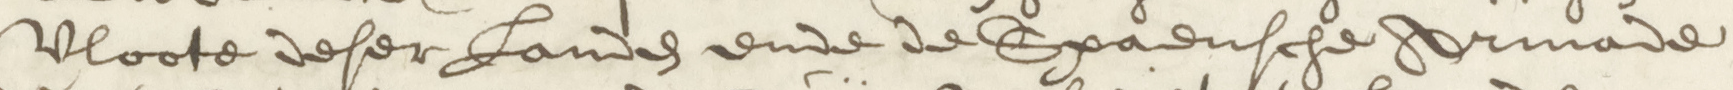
Vloote deser Landen ende de Spaensche Armade
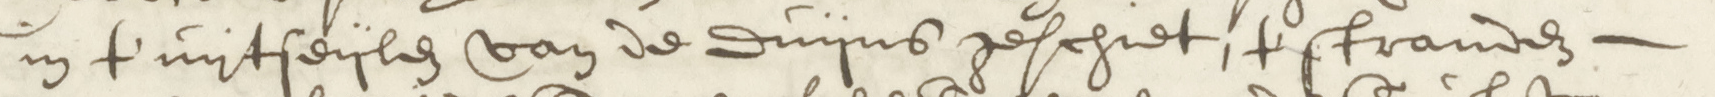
in t"uijtseijlen van de Duijns geschiet, t'stranden —
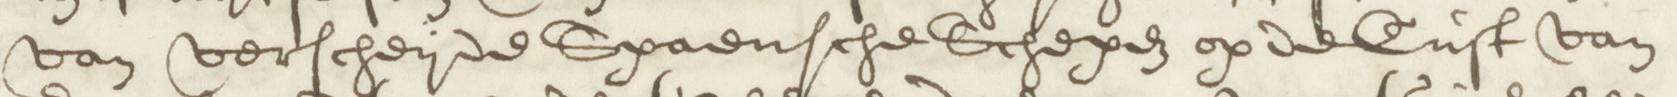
van verscheijde Spaensche Schepen op de Cust van
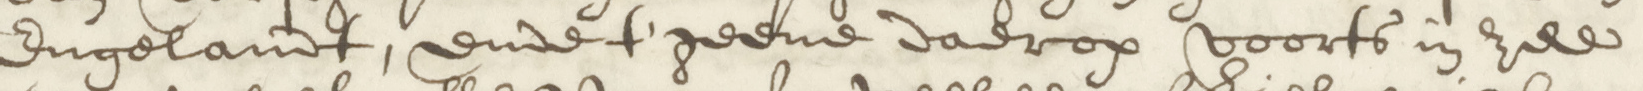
Engelandt, ende t'geene daerop voorts in zee
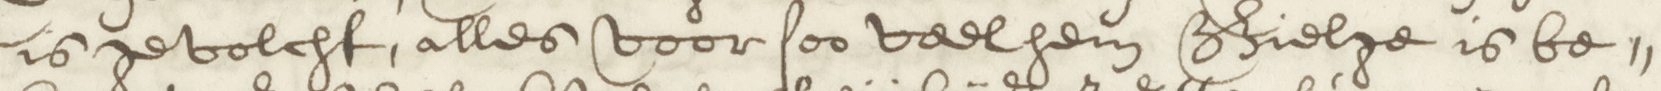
is gevolcht, alles voor soo veel hem Bielge is be„
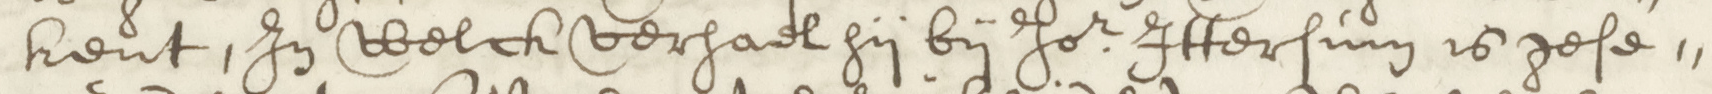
kent, In welck verhael hij bij Jor Ittersum is gese„
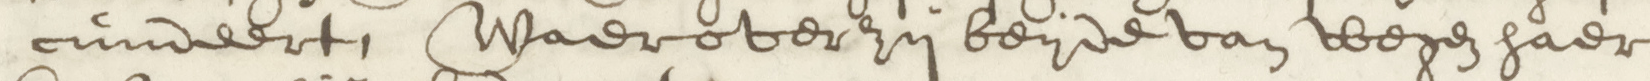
cundeert. Waerover zij beijde van wegen haer
